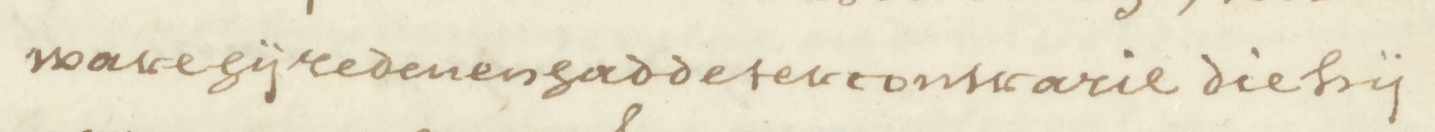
ware hij redenen hadde ter contrarie die hij
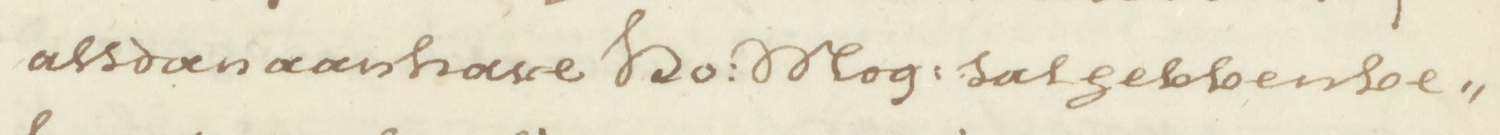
alsdan aan hare Ho:Mog: sal hebben be„
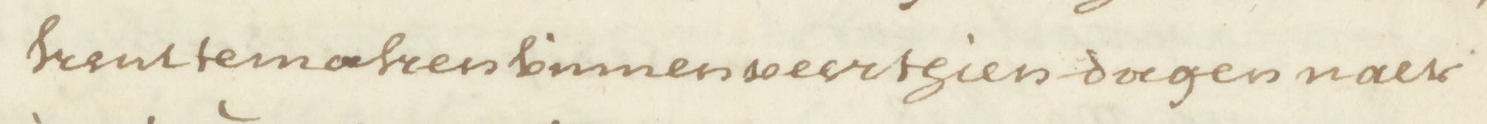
kent te maken binnen veerthien dagen naer
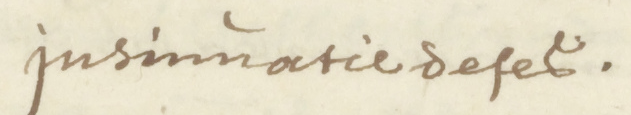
insinuatie deses.
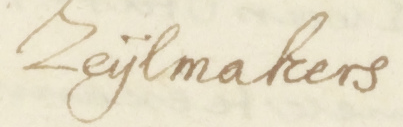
Zijlmakers
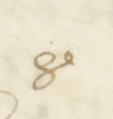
ca
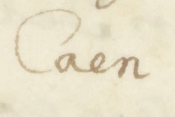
Caen
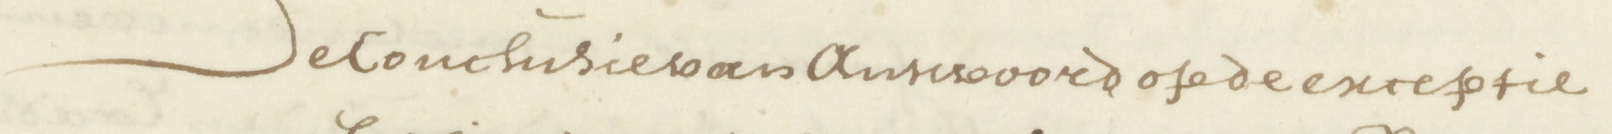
De Conclusie van Antwoord op de exceptie
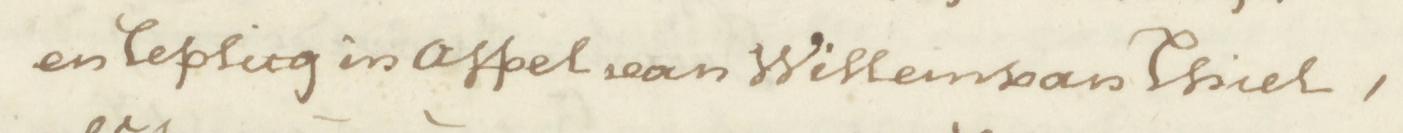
en Replicq in appel van Willem van Thiel,
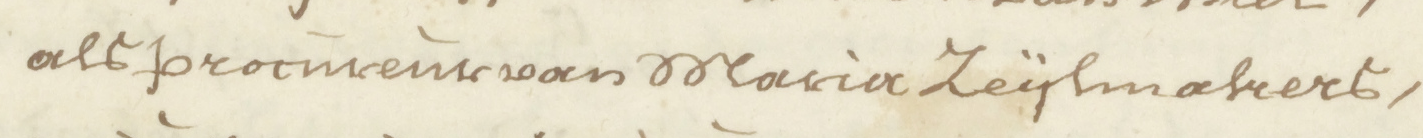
als procureur van Maria Zeijlmakers,
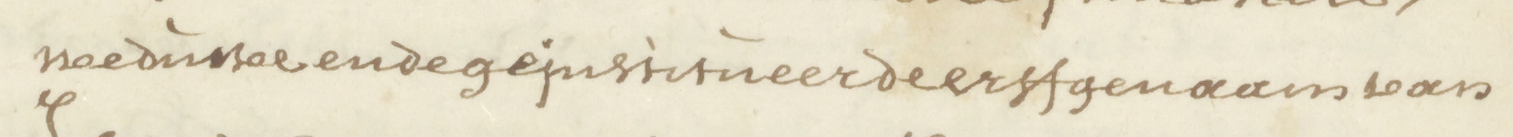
weduwe ende geinstitueerde erffgenaam van
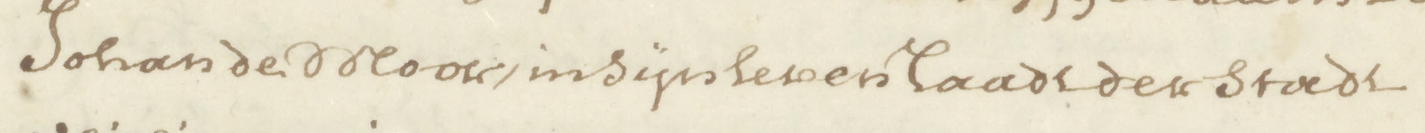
Johan de Moor, in sijn leven Raadt der stadt
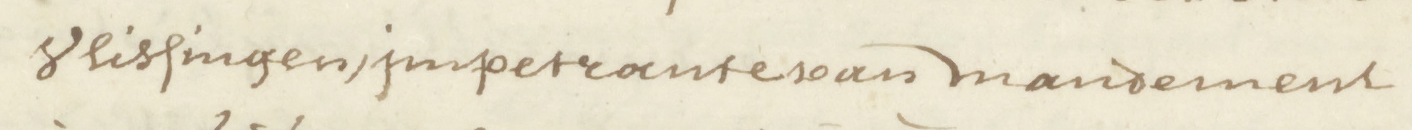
Vlissingen, impetrante van mandement
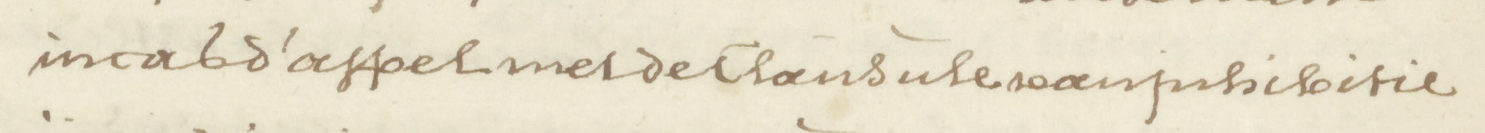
in cas d'appel met de clausule van inhibitie
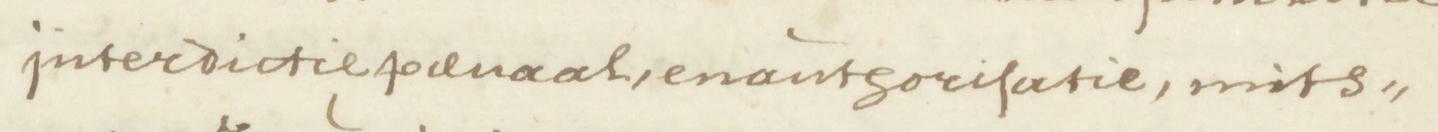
interdictie penaal, en authorisatie, mits„
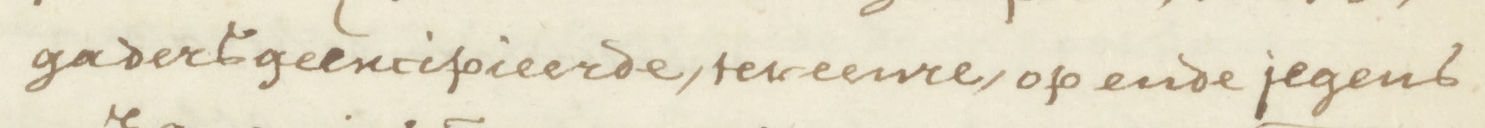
gaders geexcipieerde, ter eenre, op ende jegens
